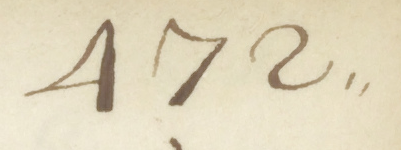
472.
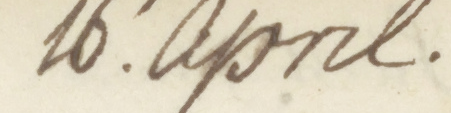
16. April.
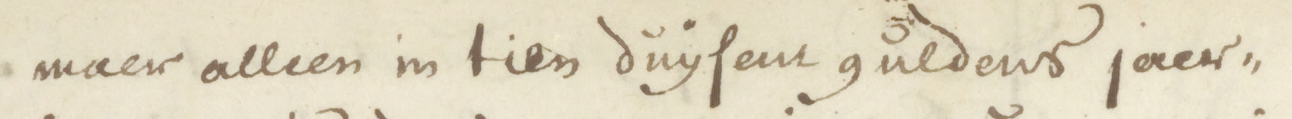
maer alleen in tien duijsent guldens jaer„
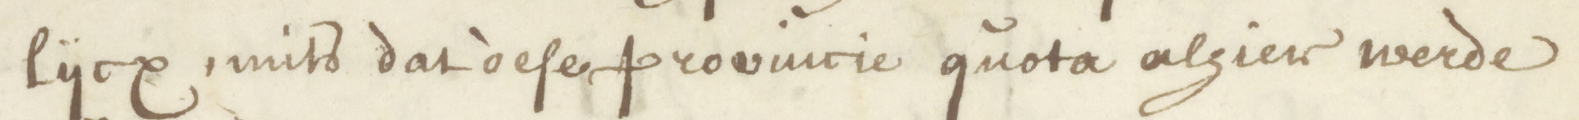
lijcx, mits dat dese provincie quota alhier werde
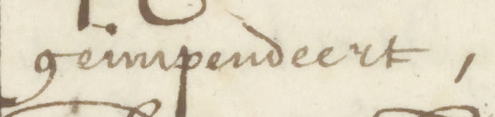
geimpendeert.
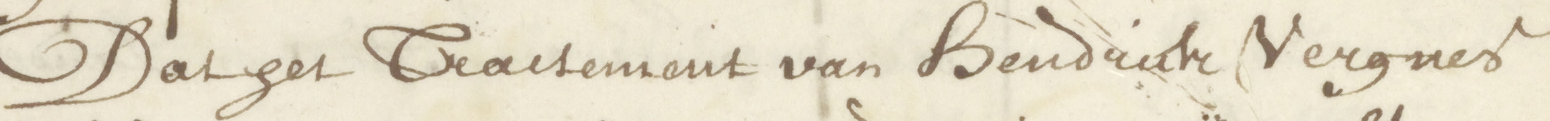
Dat het Tractement van Hendrick Vergues
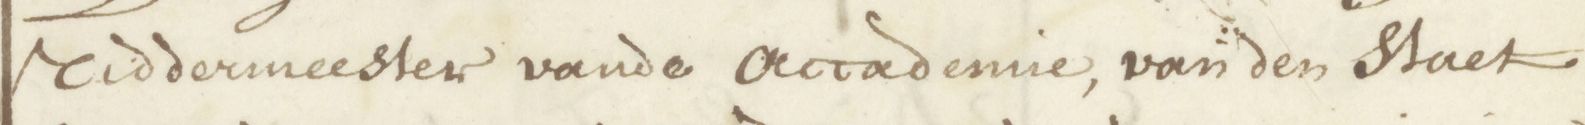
riddermeester vande Accademie, van den Staet
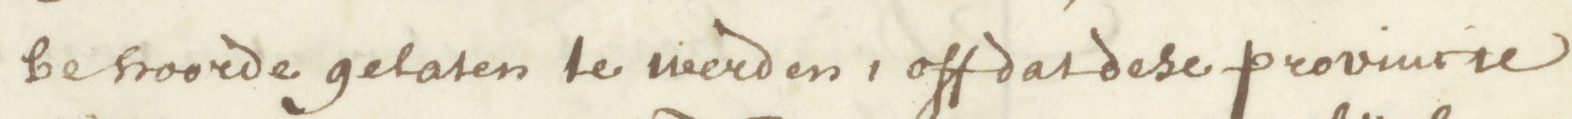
behoorde gelaten te werden, off dat dese provincie
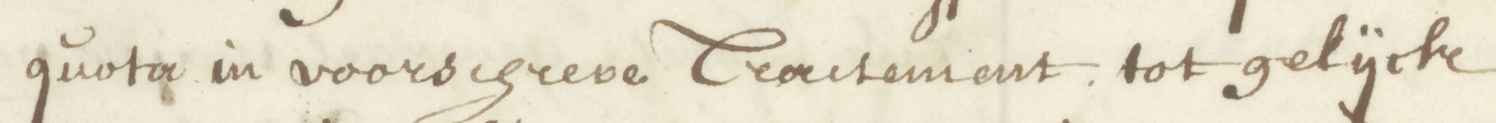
quota in voorschreve Tractement, tot gelijck
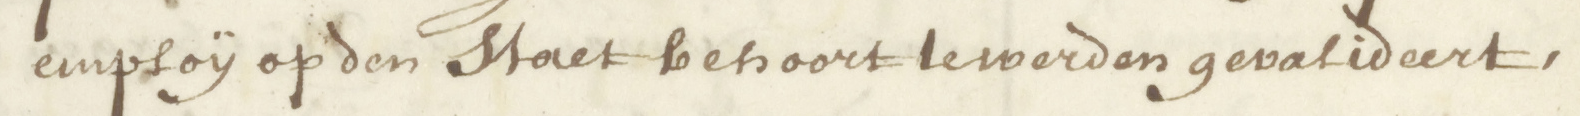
emploij op den Staet behoort te werden gevalideert.
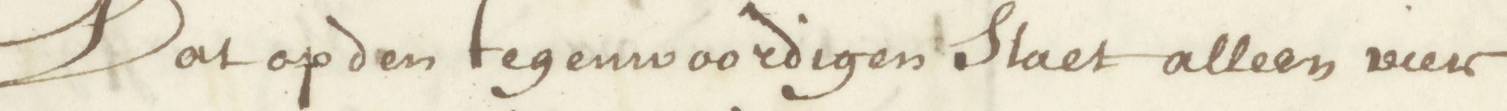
Dat opden tegenwoordigen Staet alleen vier
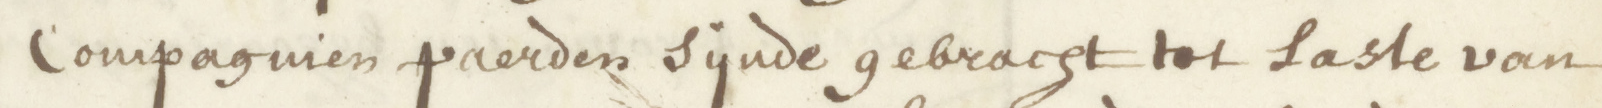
Compagnien paerden sijnde gebracht tot laste van
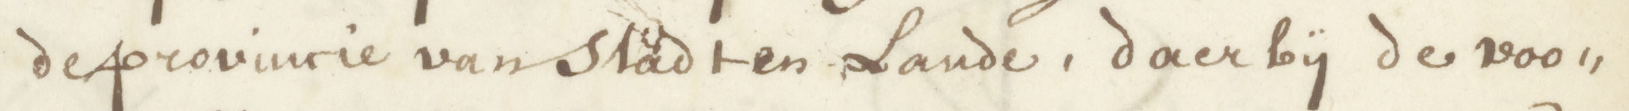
de provincie van Stadt en Lande, daerbij de voo„
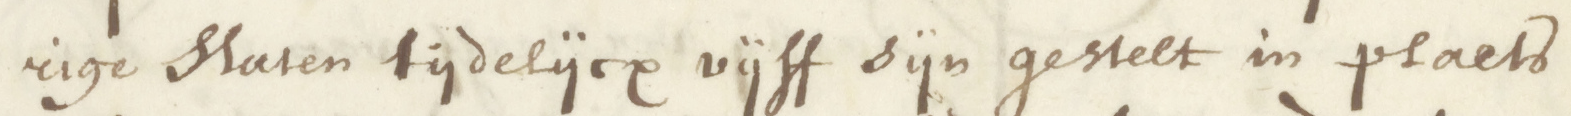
rige Staten tijdelijcx vijff sijn gestelt in plaets
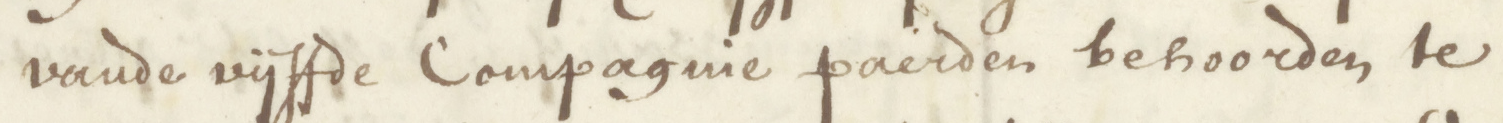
vande vijffde Compagnie paerden behoorden te
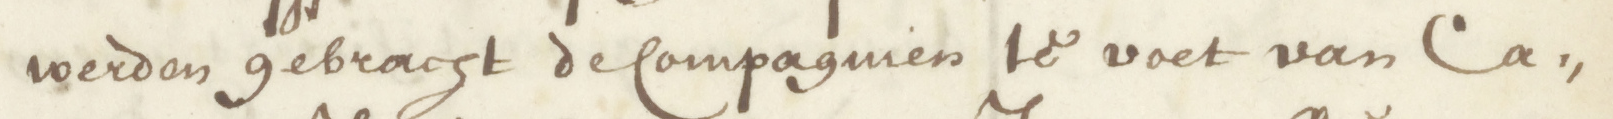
werden gebracht de Compagnien te voet van Ca„
